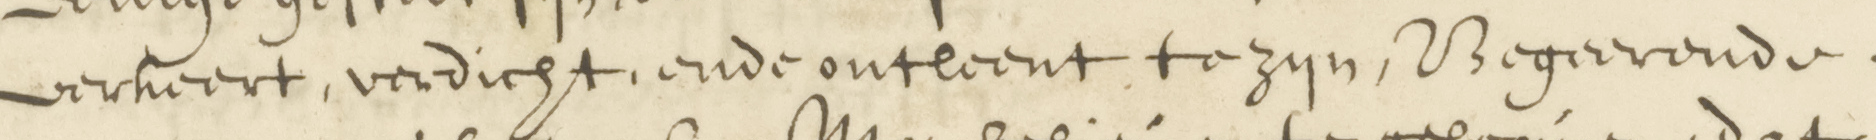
verkeert, verdicht, ende ontleent te zyn, Begeerende
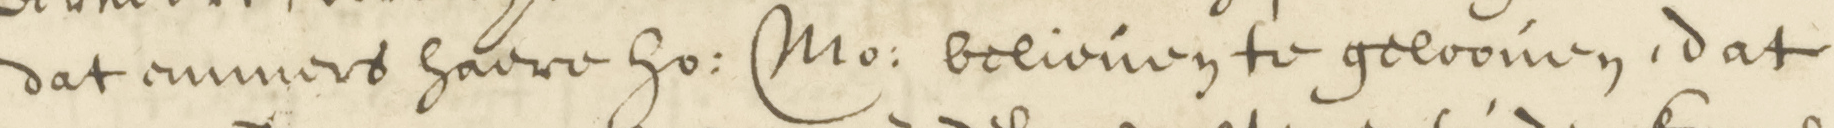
dat emmers haere ho:Mo: belieuen te geloouen, dat
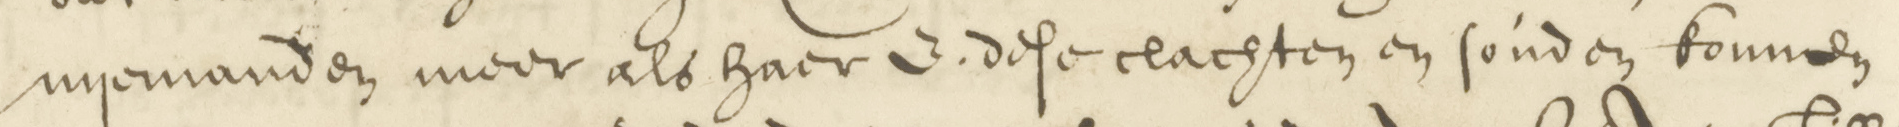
nyemand en meer als haer E. dese clachten en souden konnen
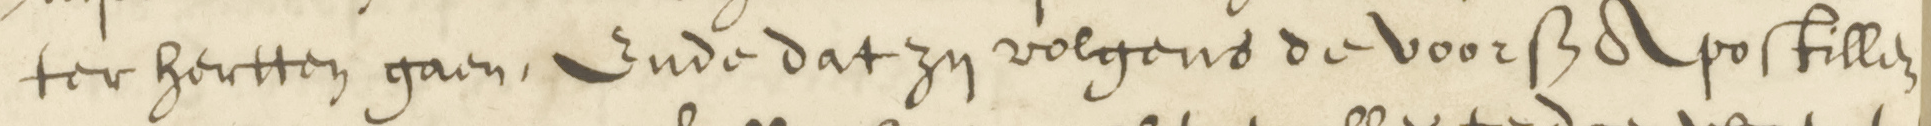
ter hertten gaen, Ende dat zy volgens de voors Apostillen
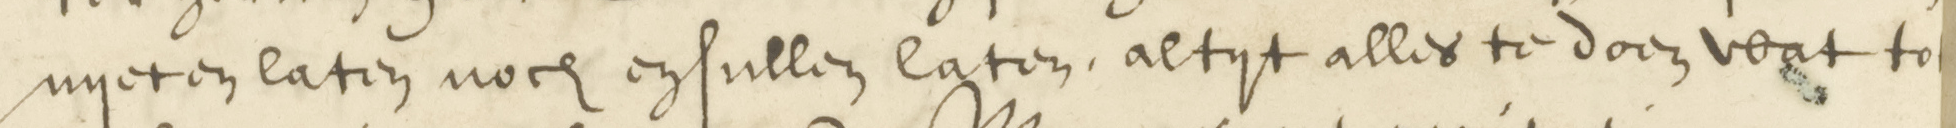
nyet en laten noch en sullen laten, altyt alles te doen wat te
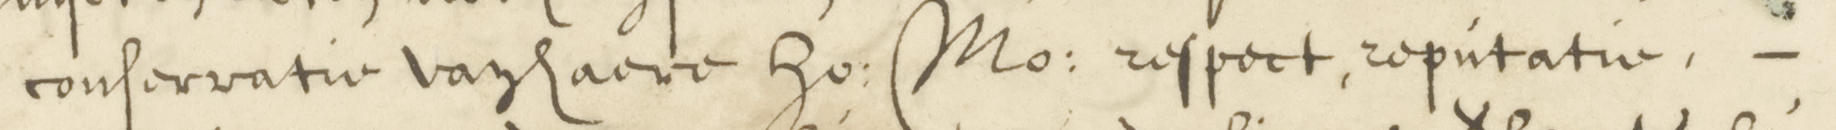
conservatie van haere ho:Mo: respect, reputatie, -
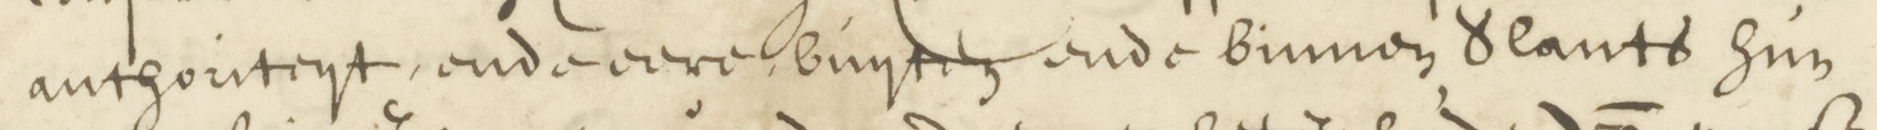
authoriteyt, ende eere buyten ende binnen Slants hun
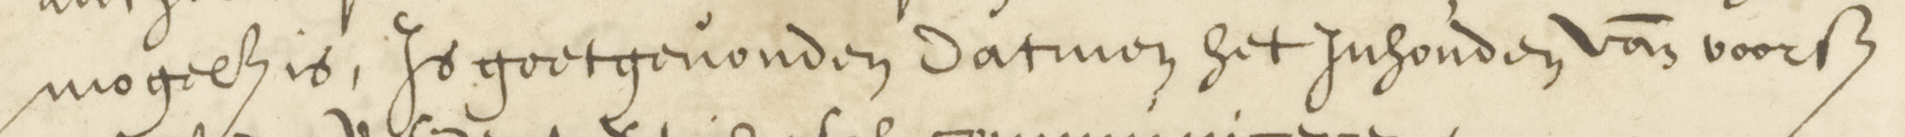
mogel is, Is goetgeuonden datmen het Inhouden van voors
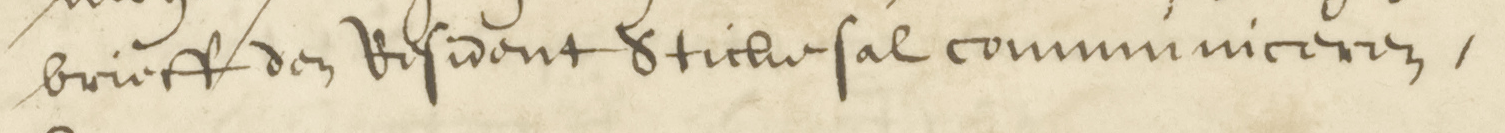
brieff den Resident Sticke sal communiceren.
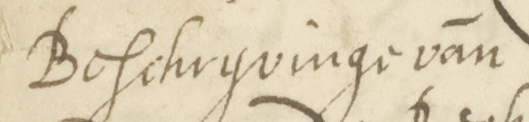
Beschrijvinge van
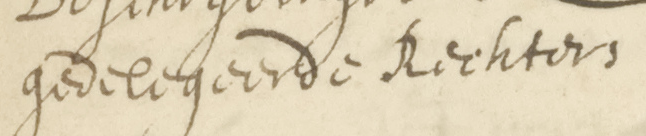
gedelegeerde Rechten
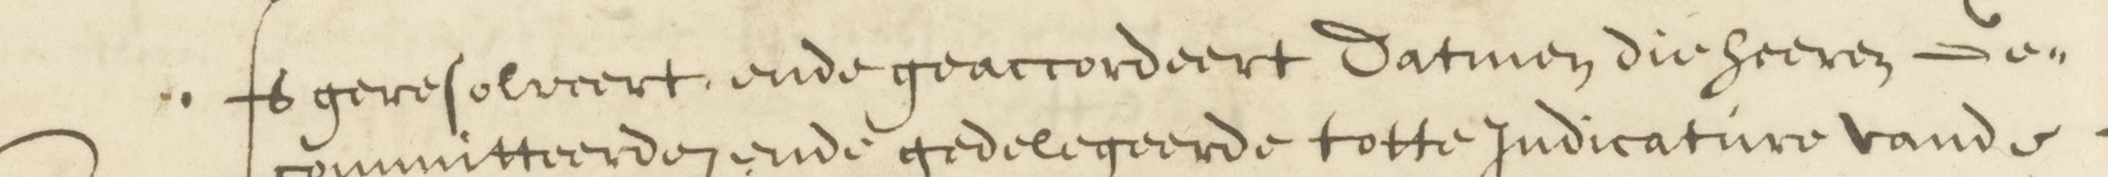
Is geresolveert, ende geaccordeert Datmen die heeren Ge,,
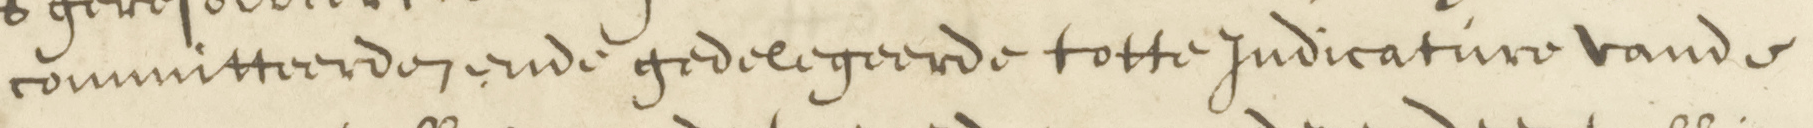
„committeerden ende gedelegeerde totte Judicature vande
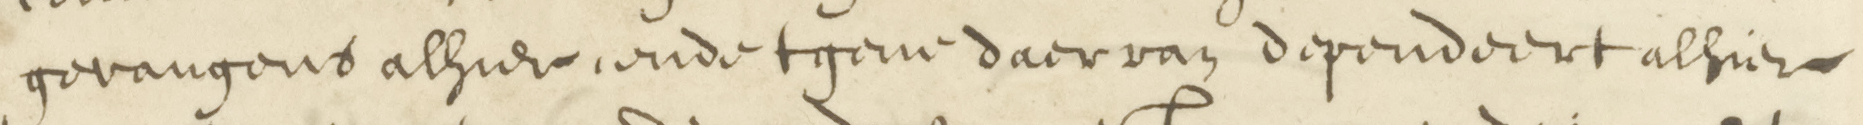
gevangens alhier, ende tgene daer van dependeert alhier
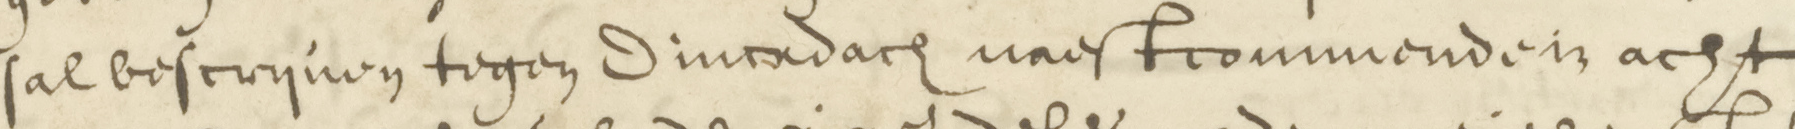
sal bescryuen tegen Dincxdach naestcommende in acht
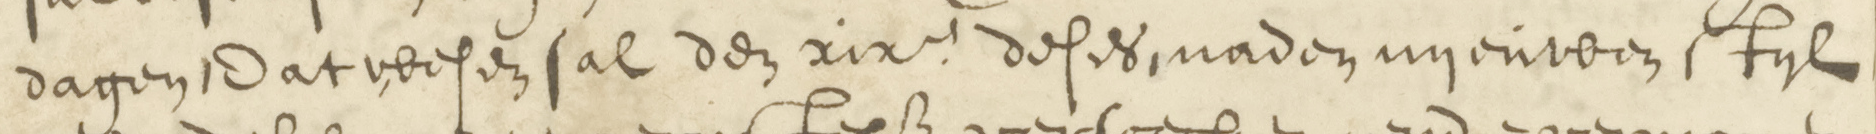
dagen, dat wesen sal den xixe. deses, naden nyeuwen styl
